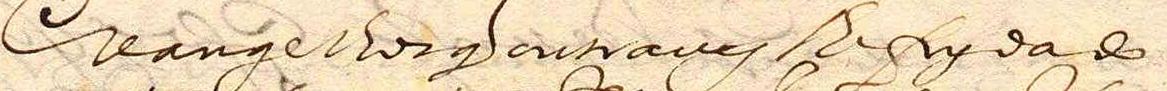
Evangelhos q̄ outra ves lhe foy dado
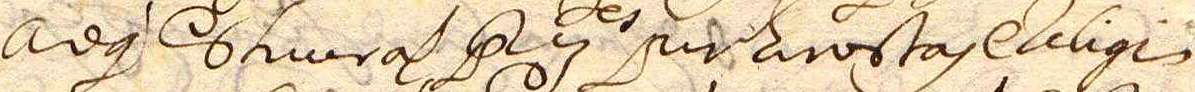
ao q̄ estiueraõ pRez.tes por honestas e Religi
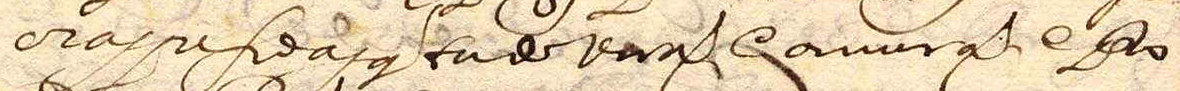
ozas pessoas q̄ tudo viraõ e ouuiraõ e pRo
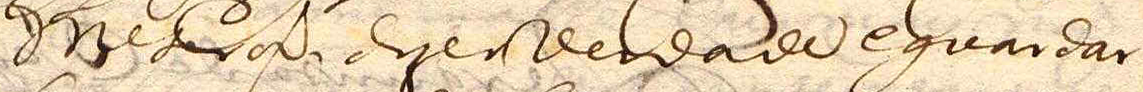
Meteraõ dizer verdade e guardar
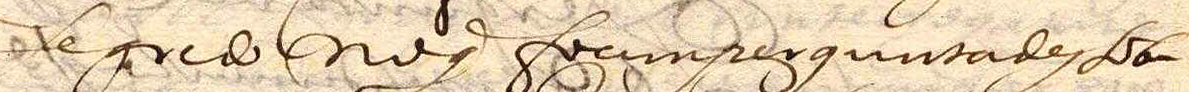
segredo no q̄ focem perguntades sob
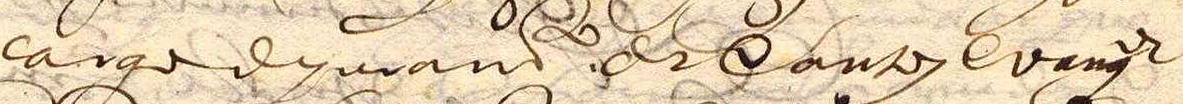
cargo do juram.to dos Santos evang.os
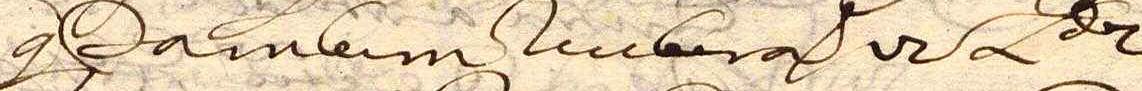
q̄ tambem Receberaõ os L.dos
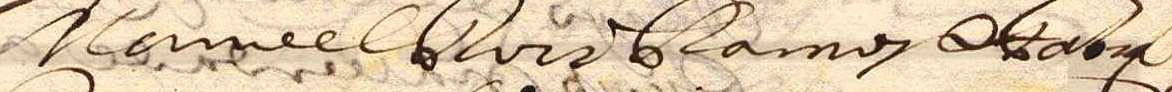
Manoel Roiz̄ Ramos e Fabião
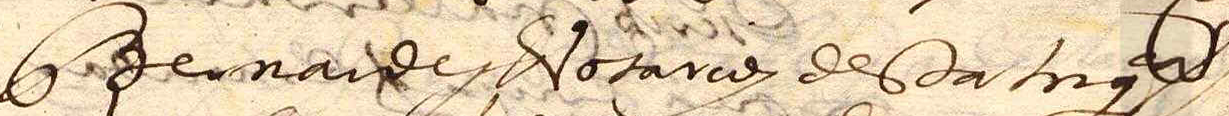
Bernardes Notarios desta Inq.caõ
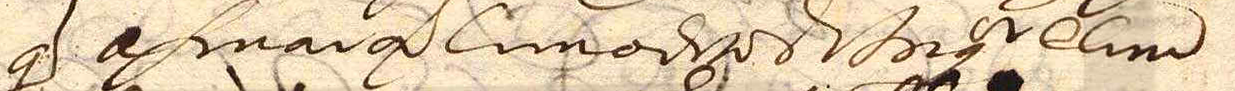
q̄ asinaraõ Com os ditos srs Inq.or e com
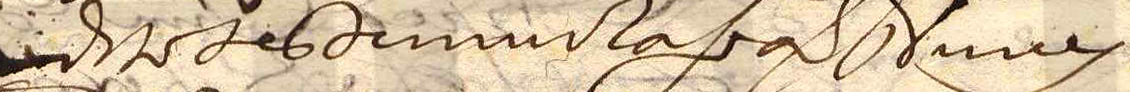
dito testemunha Joaõ Nunes
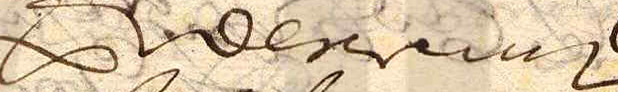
& o escreuj
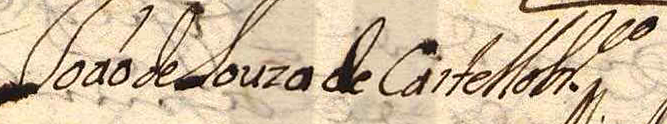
Ioaõ de Souza de Castellobr.co
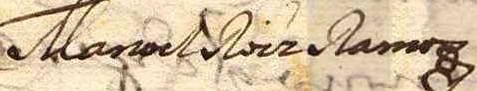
Manoel Roiz̄ Ramoz
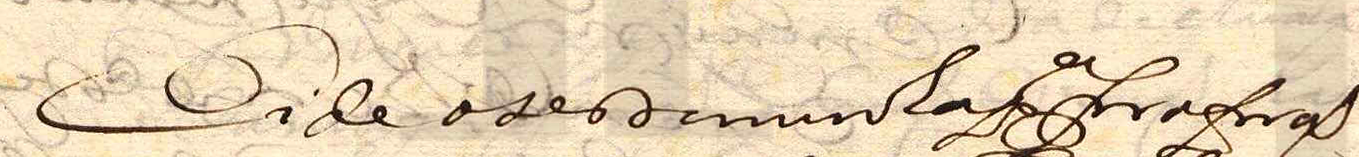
E ide o testemunha p.a fora foraõ
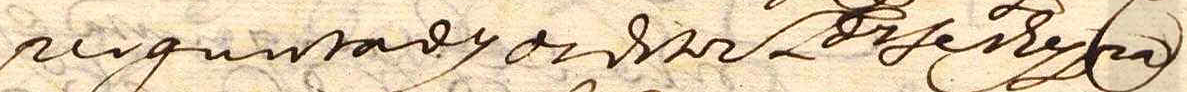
perguntados os ditos L.dos se lhes pa
